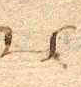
25
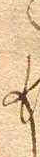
Rꝭ
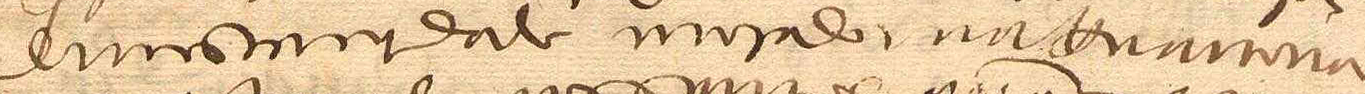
dor nesta cydade morador na Rua noua
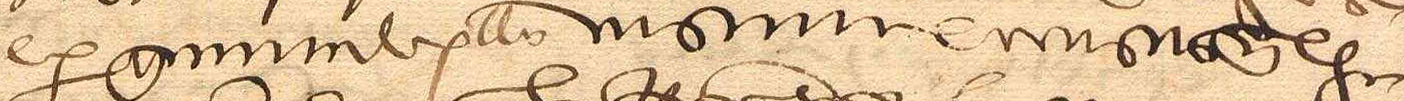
e ꝑguntado pl̄lo custume e cousas q̄ lhe
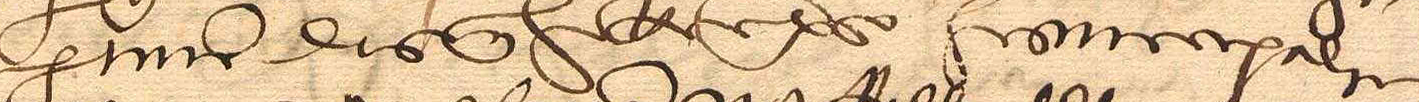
ꝑtencē dise q̄ ho Reo p̄so he seu conpadre
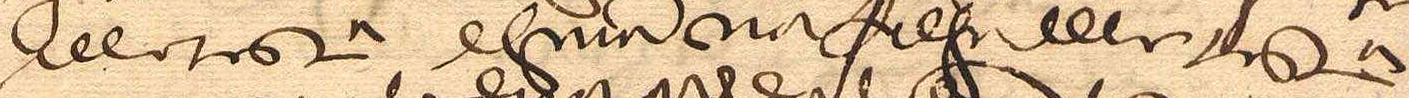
delle testa de huuā sua fylha delle testa
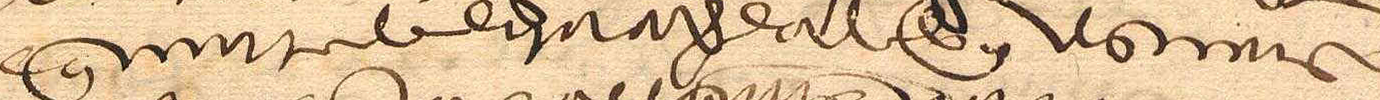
e q̄ comtodo dira a ꝟdade do q̄ deste caso
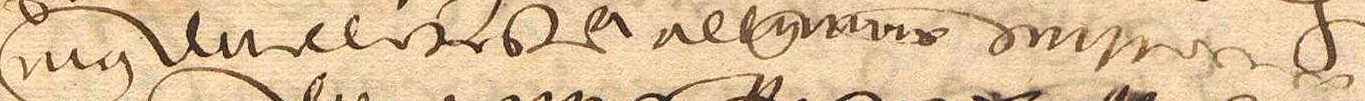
mādou elle testa allguuns serujcos co
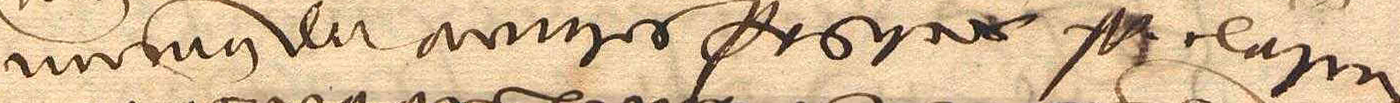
mo mādou a outros fysycos .ss. clara
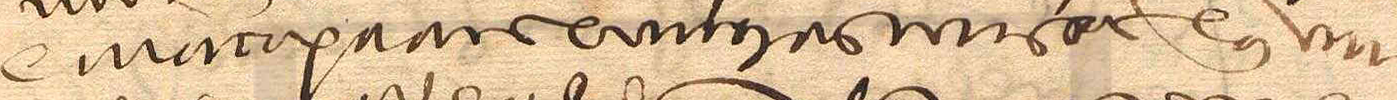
e macapaaes e outras cousas e q̄ com
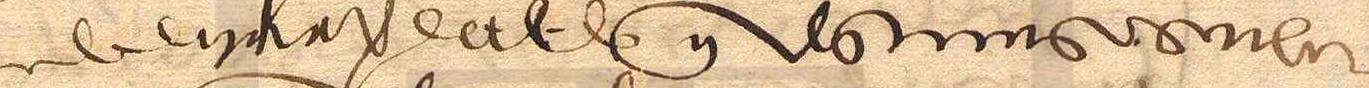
todo dira a ꝟdade do q̄ deste caso souber
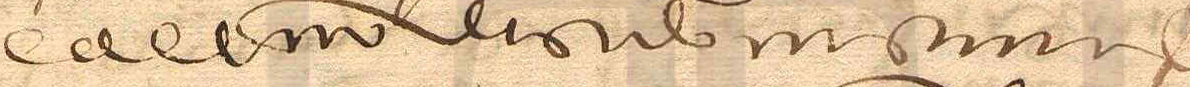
e all nō dise do custume
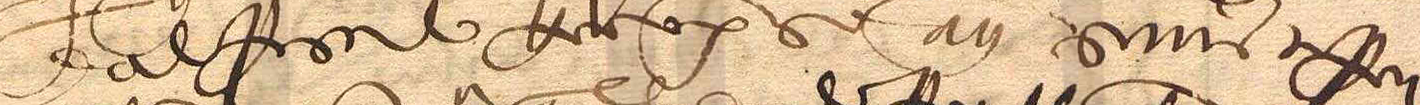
da defesa do Reo p̄so a q̄ somēte foy
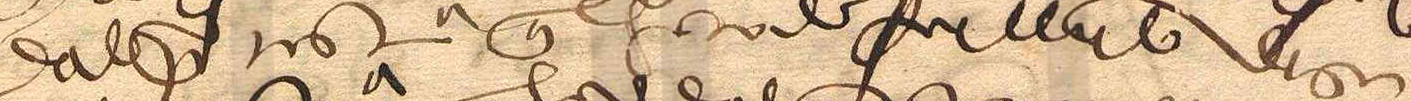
dado p̄o testa q̄ lhe todo foy llydo dise
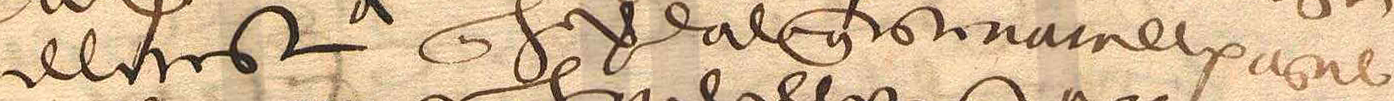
elle testa q̄ he ꝟdade q̄ este natall pasado
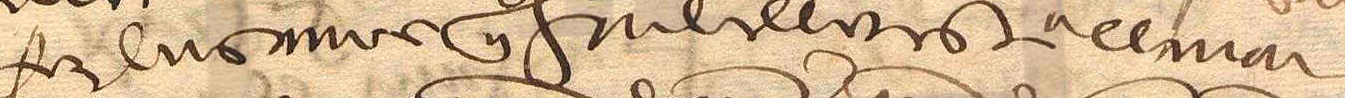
fez dous anos q̄ hyndo elle testa lleuar
